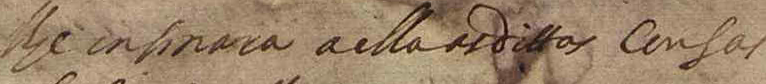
lhe ensinara a ella as dittas cousas
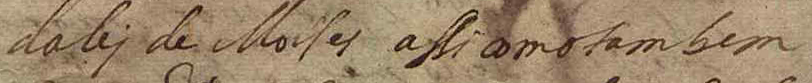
da lej de Moises assi como tambem
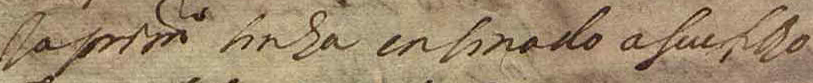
Ja primro tinha ensinado a seu filho
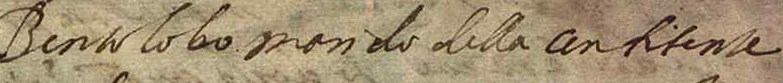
Bento lobo marido della confitente
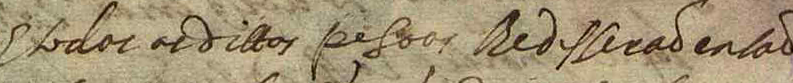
E todas as dittas pesoas lhe disseraõ entaõ
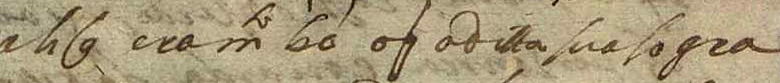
ali q̄ era mto bō o q̄ a ditta sua sogra
